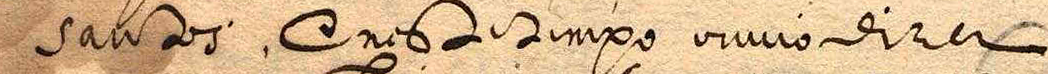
santos, e neste tempo ouuio dizer
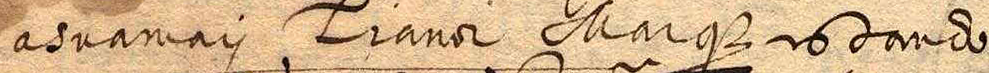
a sua may Lianor Marq̅z estando
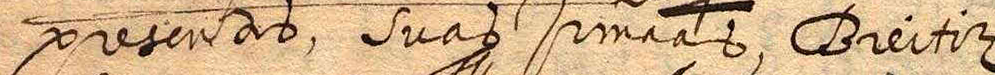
presentes, suas Jrma̅as, Breitiz
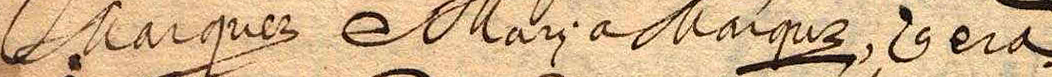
Marquez e Marja Marquz, q̅ era
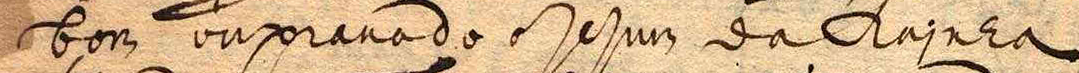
bom ou prouado o JeJum da Rajnha
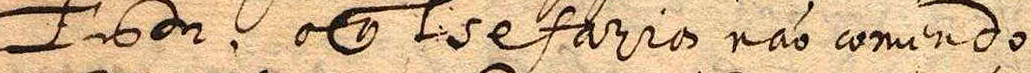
Ester. o q̅l se fazia não comendo
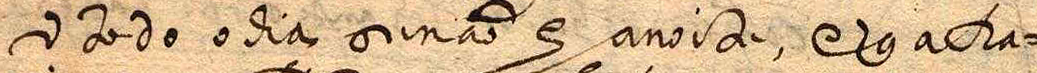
e̅ todo o dia se não ha noite, e q̅ a Ra
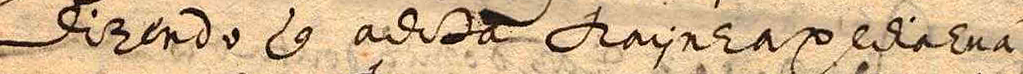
dizendo q̅ a dita Raynha pedia hu̅a
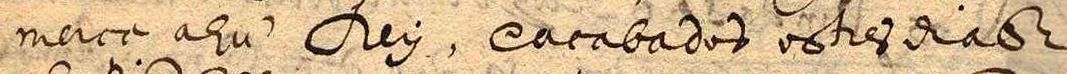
merçe a hu̅ Rey, e acabados os tres dias
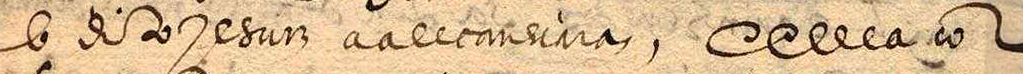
do dito Jesum a allcansiara, e ellla co̅
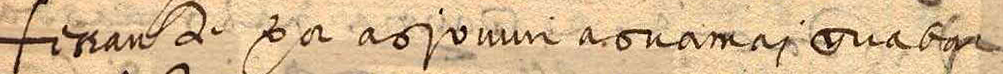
fessante por asj ouuir a sua maj guabar
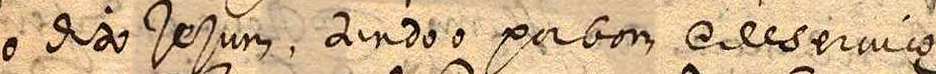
o dito Jejum, tendo o por bom e de seruiço
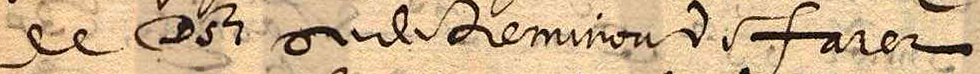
de D̅s se detreminou e̅ o fazer
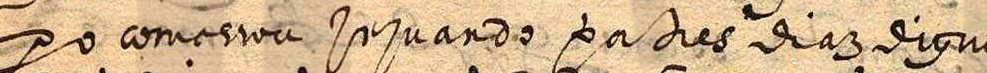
e o comessou Jejuando por tres diaz diguo
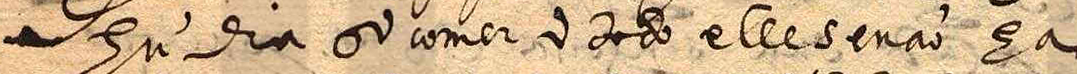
hu̅ dia se̅ comer e̅ todo elle senão ha
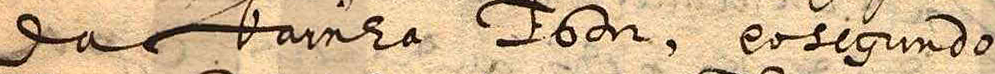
da Rainha Ester, e o segundo
